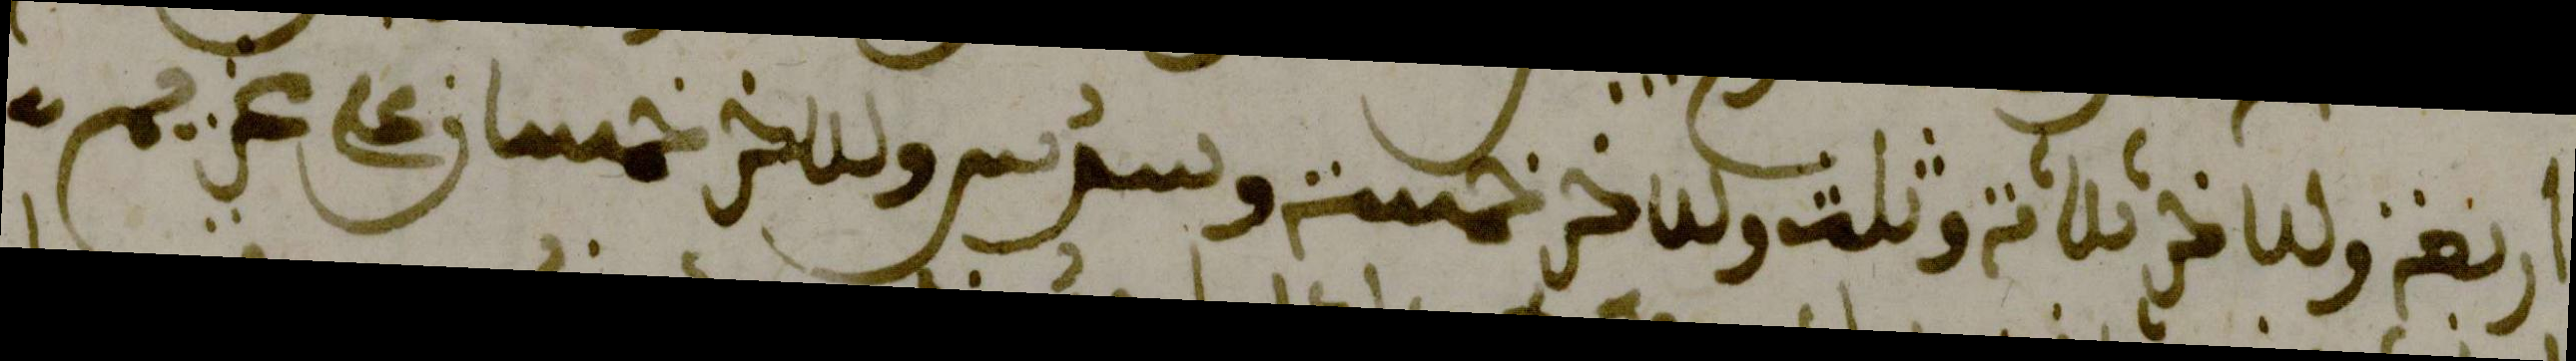اربعة وللاخر ثلاثة وثلث وللاخر خمسة وسدس وللاخر خمسان على غريم
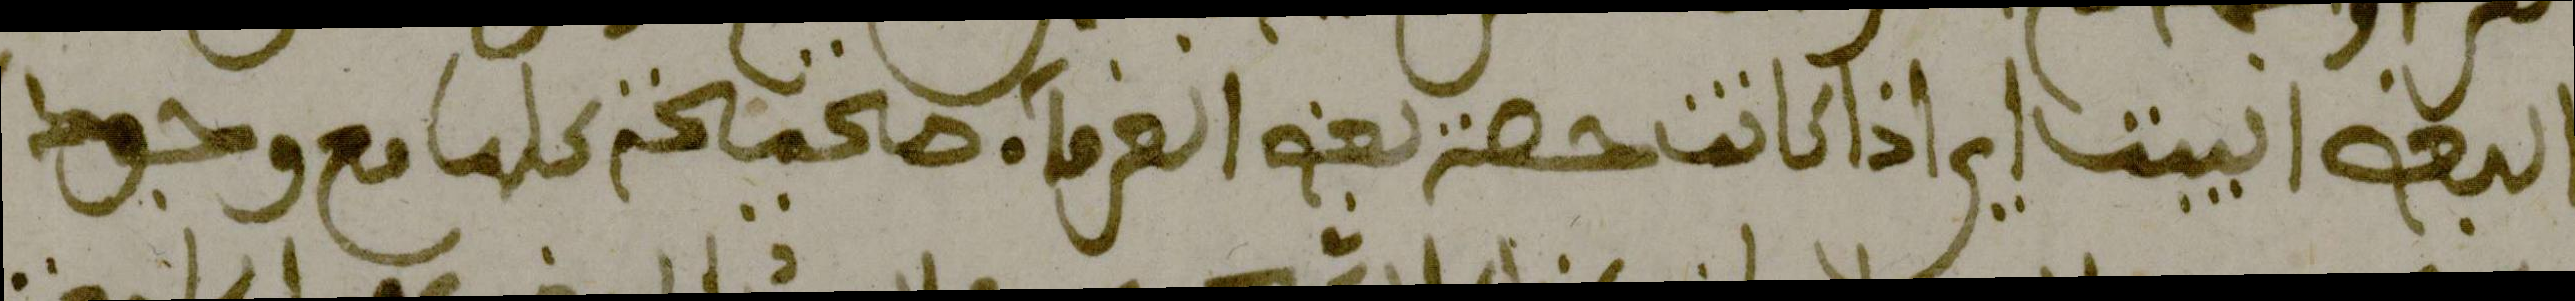البعض البيت اي اذا كانت حصة بعض الغرماء صحيحة كلها مع وجود
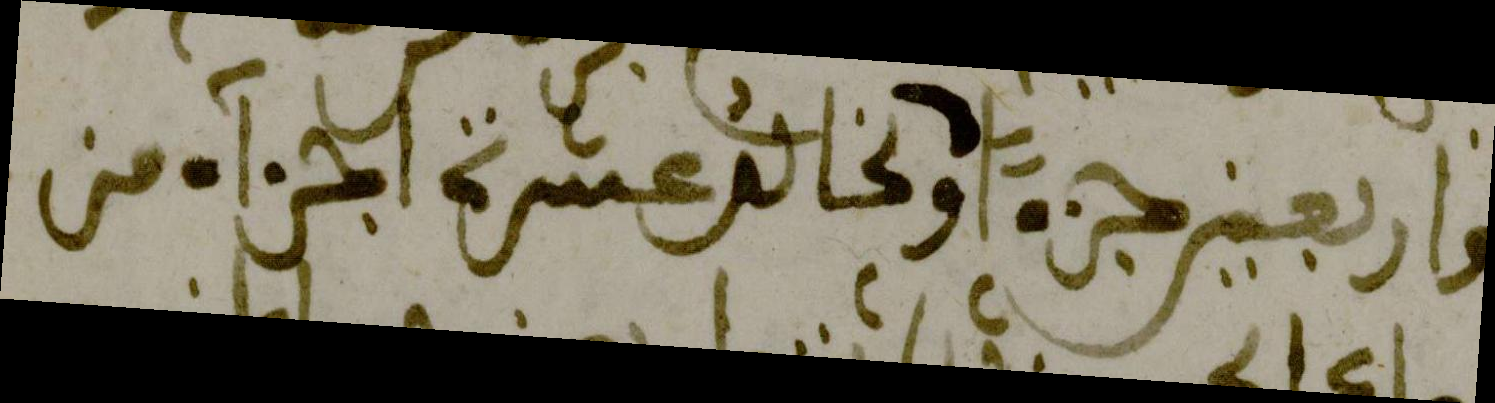واربعين جزءًا ولخالد عشرة اجزاء من
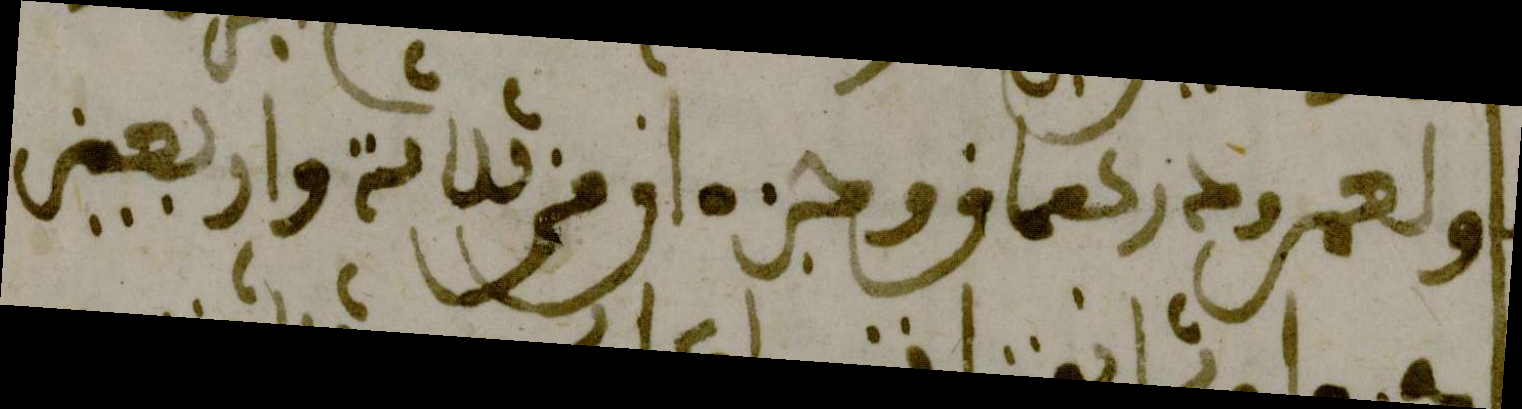ولعمر دررهمان وجزءان من ثلاثة واربعين
